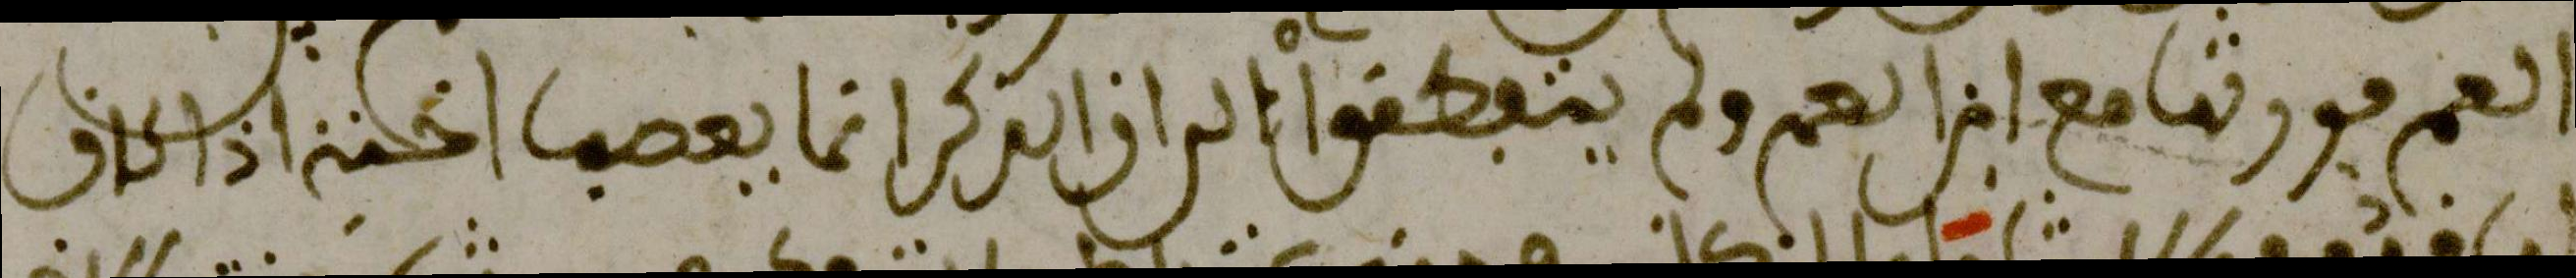العم فورثها مع ابن العم ولم يتفطنوا الى ان الذكر انما يعصب اخته اذا كان
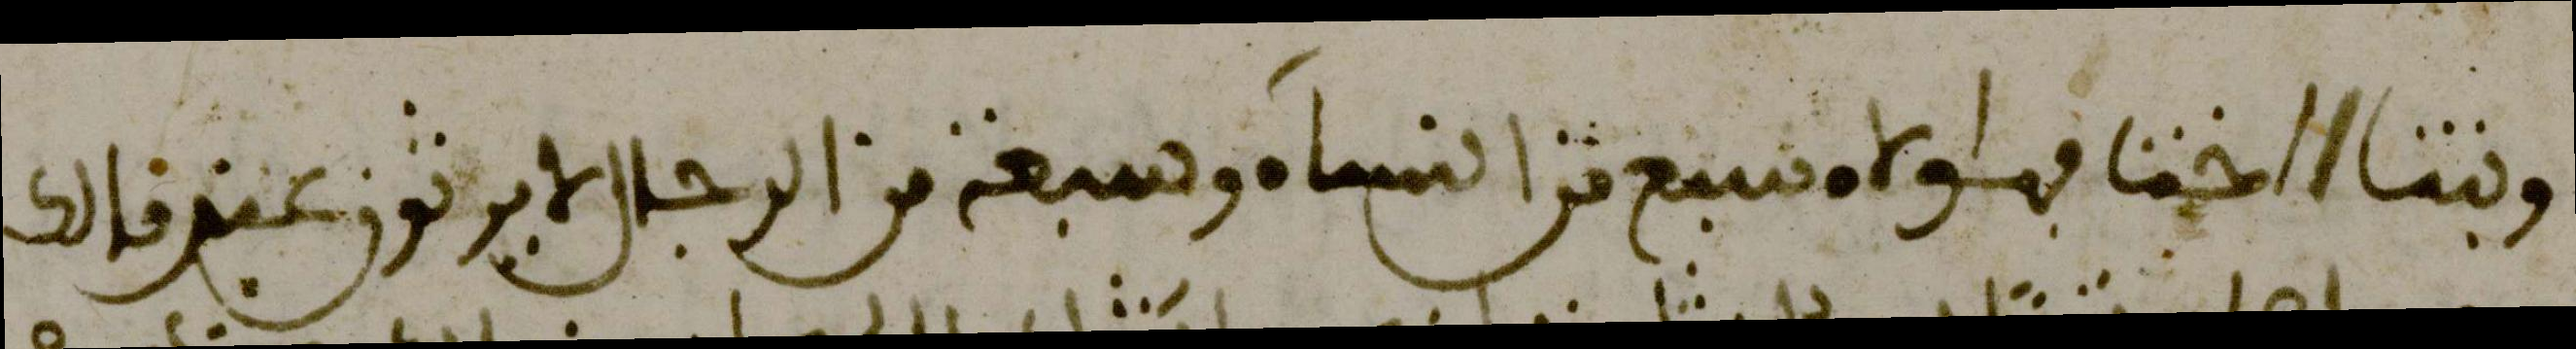وبنت الاخت فهولاء سبع من نساء وسبعة من الرجال لا يرثون عند مالك
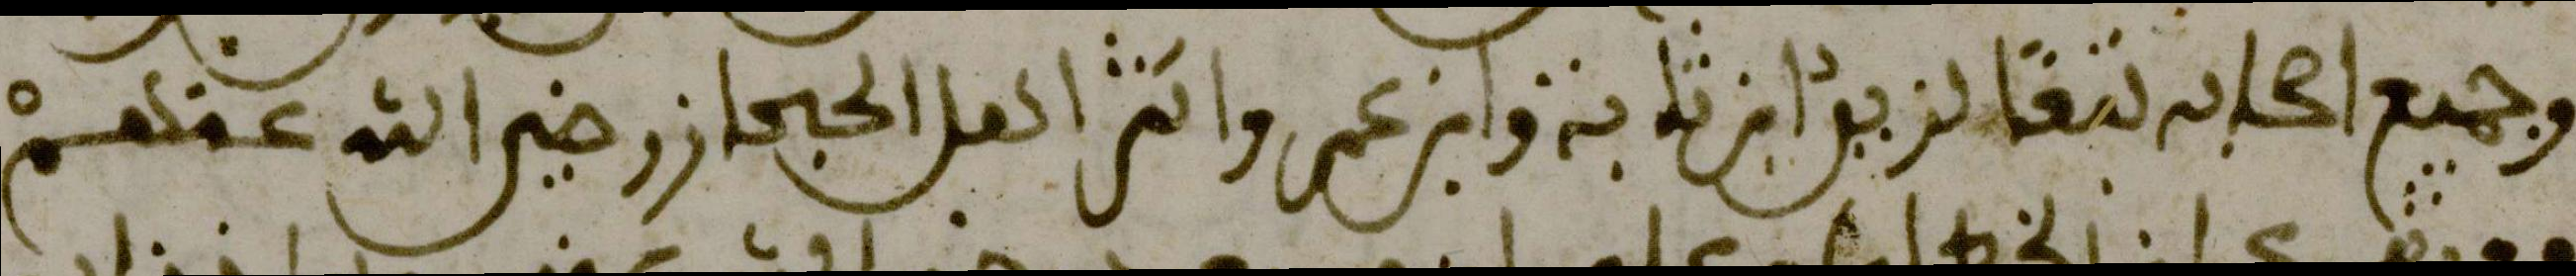ْوجميع اصحابه تبعًا لزيد ابن ثابت وابن عمر واكثر اهل الحجاز رضي الله عنهم
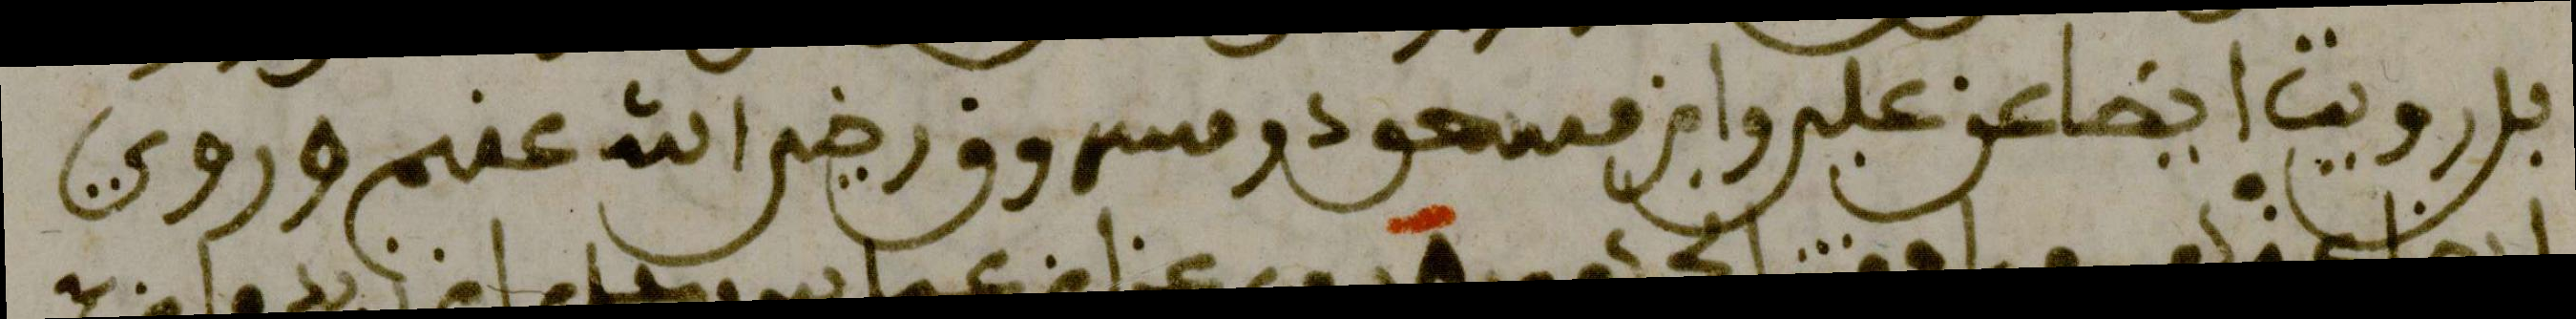بل رويت ايضا عن علي وابن مسعود ومسروق رضي الله عنهم وروي
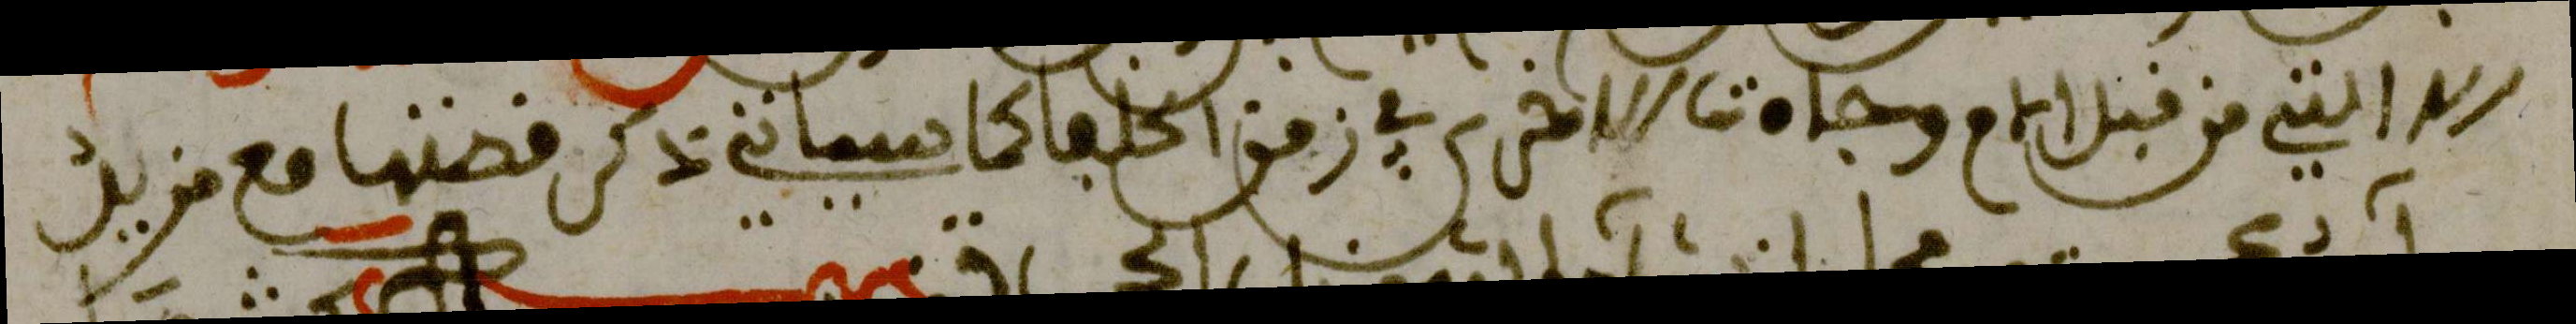الا التي من قبل الام وجاءت الاخرى في زمن الخلفا كما سياتي ذكر قصتها مع مزيد
